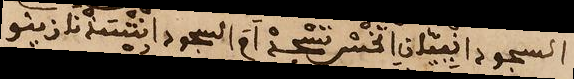السجود انييان اتخس تسجد ام السجود انتسذ نازينو
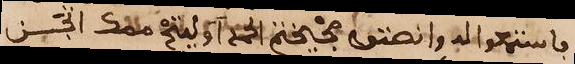فاستمعوا له وانصتوا مجيختم الحمد اوليتج ممك اتجن
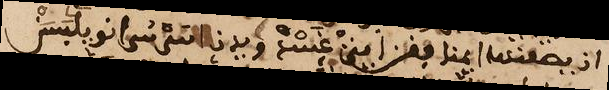ان يصنفها ايمنافقن ايتر غسد ويدن اسرسر انويلبسن
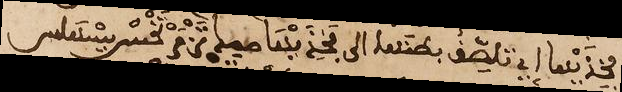فخذيها اي تلصق بطنها الى فخذيها ممك تزمر تخس يسهلس
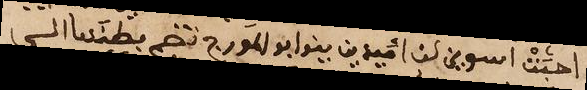احبت اسويزلن اميدن ينوا ابو المورج تضم بطنها الى
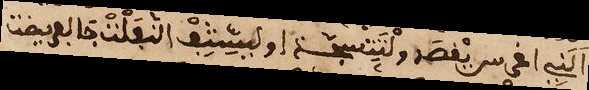الني اغرس يقصد ولتتسجذ اوليسثف النفلت جالفريضت
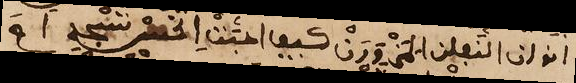انوان النفلن المزورن كيف احبت اتخس تسجد ام
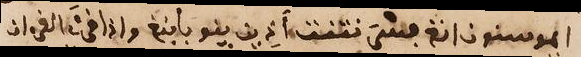ايموسنون انغ فسرنتنت اذين ينو بابنغ واذا قرءى القرءان
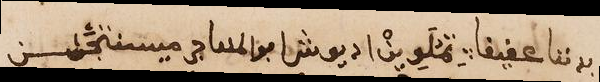بدننا عفيفا تملوين اديوش ابوالمهاجر ميسنتجسن
